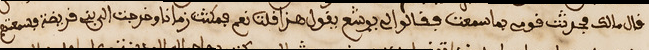قال مالك فحدثت قومى بما سمعت فقالوا لى يوشع يقول هذا قلت نعم فمكثت زمانا وخرجت الى بنى قريضة فسمعتهم
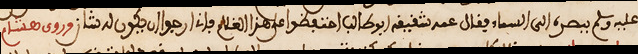عليه وسلم ببصره الى السماء فقال عمه شقيقه ابو طالب احتفظوا على هذا الغلام فانى ارجوا ان يكون له شان وروى هشام
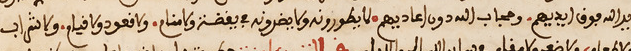يد الله فوق ايديهم وحجاب الله دون اعاديهم لما يطورونه ولا يضرونه في يقضة ولا منام ولا قعود ولا قيام ولا شراب
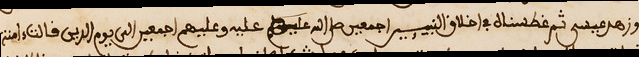وزهد عيسى ثم غطسناه في اخلاق النبيئين اجمعين صلى الله عليهم عليه وعليهم اجمعين الى يوم الدين قالت ءامنة
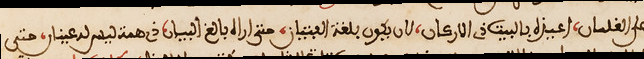على الغلمان اعيذه بالبيت ذى الاركان لان يكون بلغة الفتيان حتى اراه بالغ البيان ذى همة ليس له عينان حتى
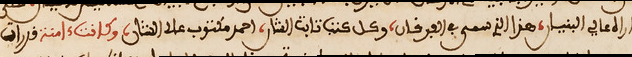اراه عالي البنيان هذا الذي سمى في الفرقان وكل كتب تابت الشان احمد مكتوب عالى الشان وكانت ءامنة قد رات
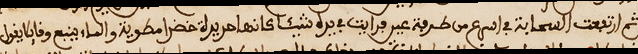ثم ارتفعت السحابة في اسرع من طرفة عين فرايت في يده شيئا كانها حريرة خضرا موطوية والماء ينبع وقائلا يقول
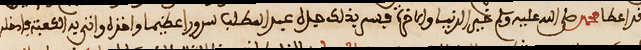قد اعطا محمد صلى الله عليه وسلم خير الدنيا والاخرة فسر بذلك جده عبد المطلب سرورا عظيما واخذه واتى به الكعبة فادخله
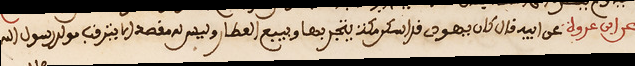على ابن عروة عن ابيه قال كان يهودى قد اسكن مكة يتجر بها ويببع العطار وليس له مقصد الا يترقب مولد رسول الله
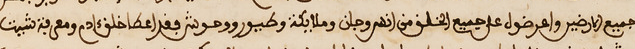جميع الارضين واعرضوه على جميع الخلق من انس وجان وملايكة وطيور ووحوش فقد اعطا خلق ءادم ومعرفة شيت
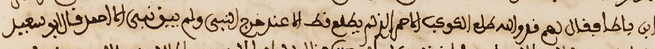ابن باطا فقال لهم قد والله طلع الكوكب الاحمر الذي لم يطلع قط الا عند خرج النبى ولم يبق نبى الا احمد قال ابو سعيد
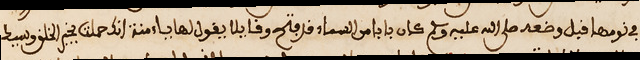في نومها قبل وضعه صلى الله عليه وسلم كان بابا من السماء قد فتح وقايلا يقول لها ياءمنة انك حملت بخير الخلق وسيد
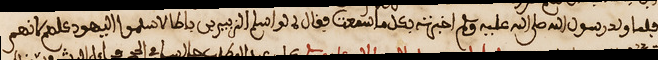فلما ولد رسول الله صلى الله عليه وسلم اخبرته بكل ما سمعت فقال وله اسلم الزبير بن باطا لاسلموا اليهود كلهم لانهم
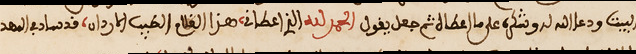البيت ودعا الله له وشكره على ما اعطاه ثم جعل يقول الحمد لله الذي اعطانى هذا الغلام الطيب الاردان قد ساد في المهد
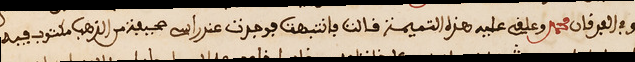وفي الفرقان محمد وعلقى عليه هذه التميمة قالت فانتبهت فوجدت عند راسى صحيفة من الذهب مكتوب فيه
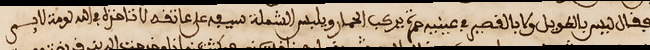فقال ليس بالطويل ولا بالقصير في عينيه حمرة يركب الحمار ويلبس الشملة سيفه على عاتقه لا تاخذه في الله لومة لائمى
